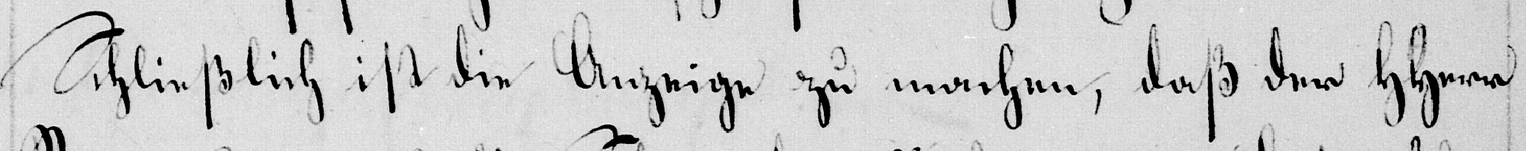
Schließlich ist die Anzeige zu machen, daß der HHerr
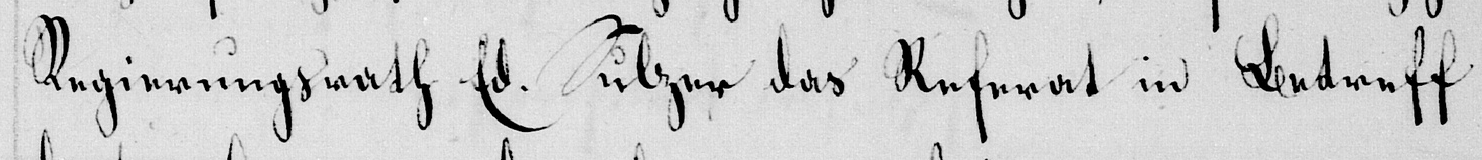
Regierungsrath Ed. Sulzer das Referat in Betreff
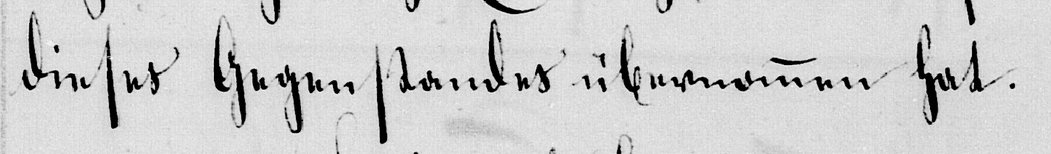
dieses Gegenstandes übernommen hat.
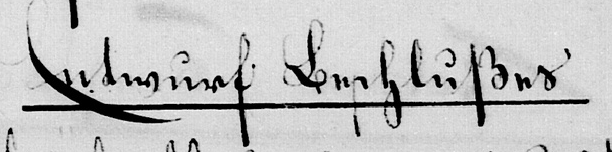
Entwurf Beschlußes
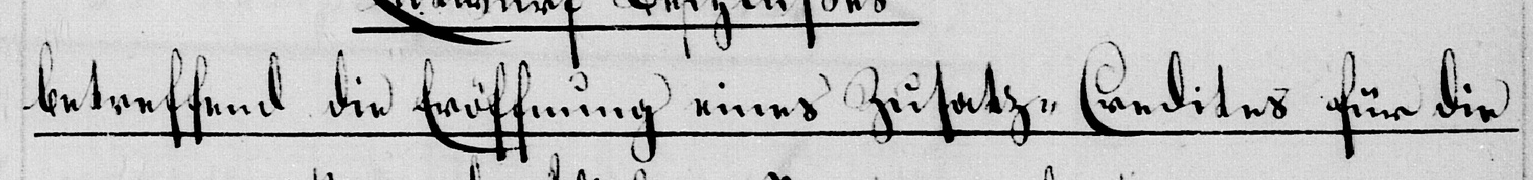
betreffend die Eröffnung eines Zusatz-Credites für die
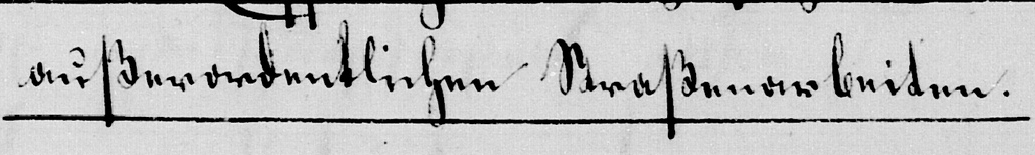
außerordentlichen Straßenarbeiten.
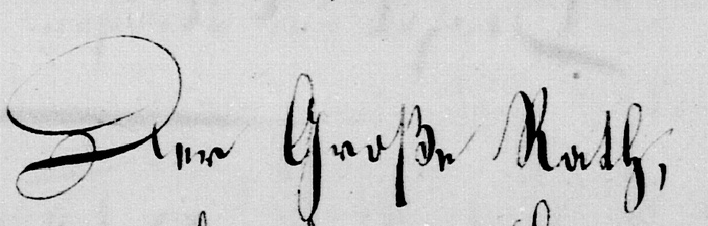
Der Große Rath,
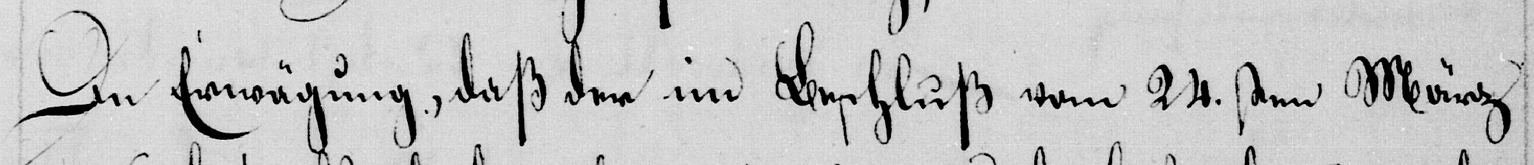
In Erwägung, daß der im Beschluß vom 24.sten März
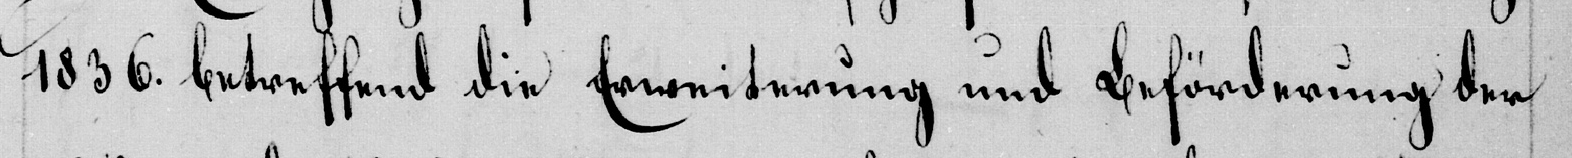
1836. betreffend die Erweiterung und Beförderung der
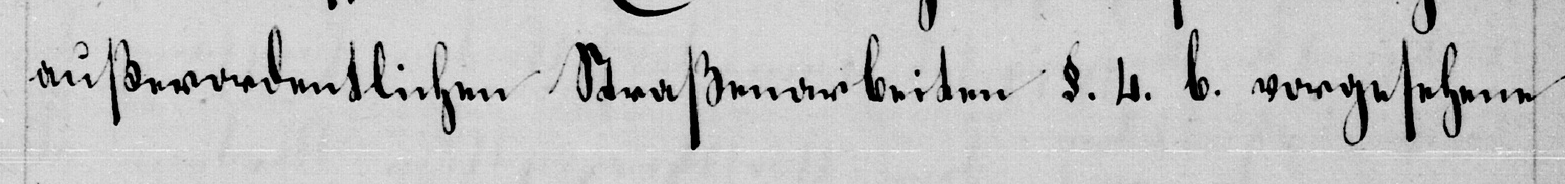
außerordentichen Straßenarbeiten §. 4. b. vorgesehene
